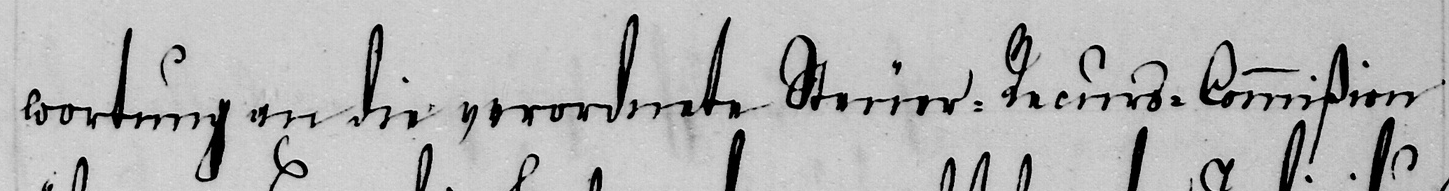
wortung an die Verordnete Steuer-Recurs-Commißion
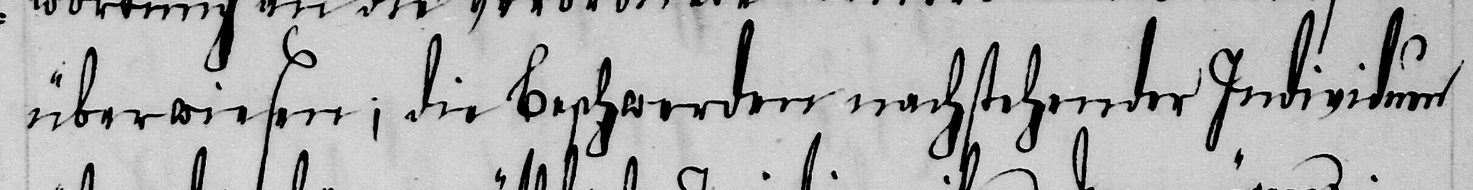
überwiesen; die Beschwerden nachstehender Individuen
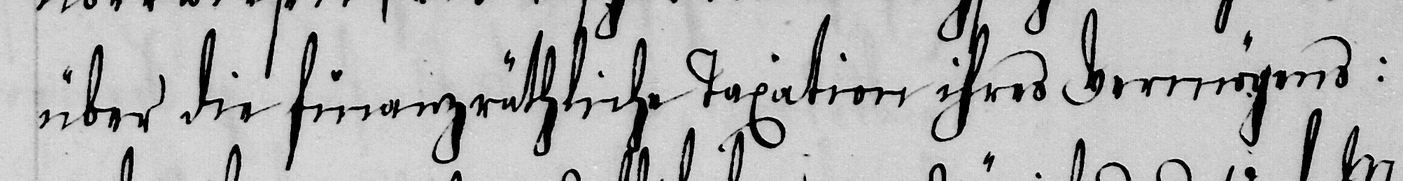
über die finanzräthliche Taxation ihres Vermögens:
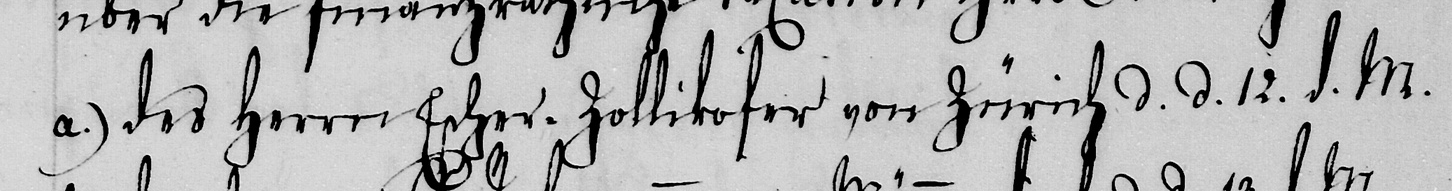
a.) des Herrn Escher-Zollikofer von Zürich d. d. 12. d. M.
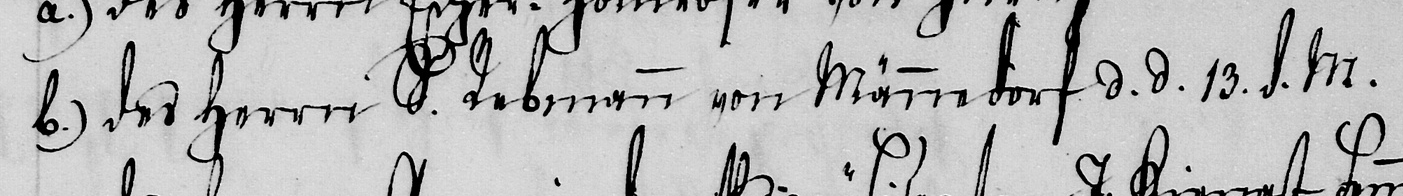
b.) des Herrn S. Rebmann von Männedorf d. d. 13. d. M.
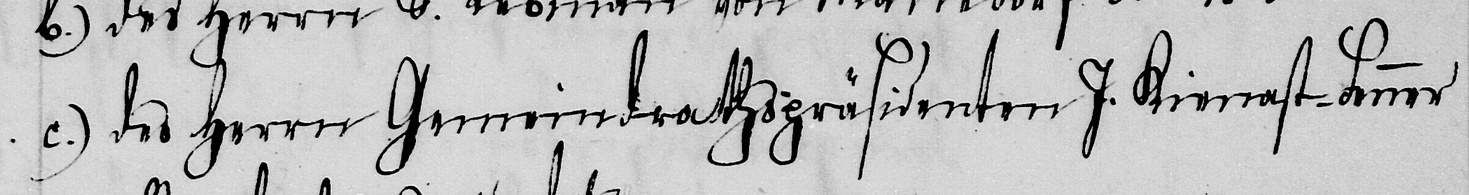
c.) des Herrn Gemeindrathspräsidenten J. Kienast-Fenner
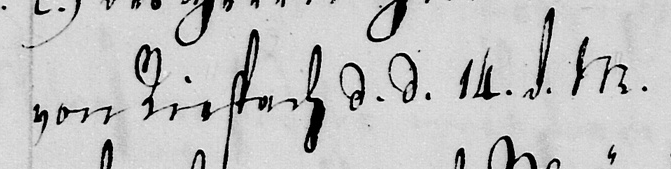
von Riespach d. d. 14. d. M.
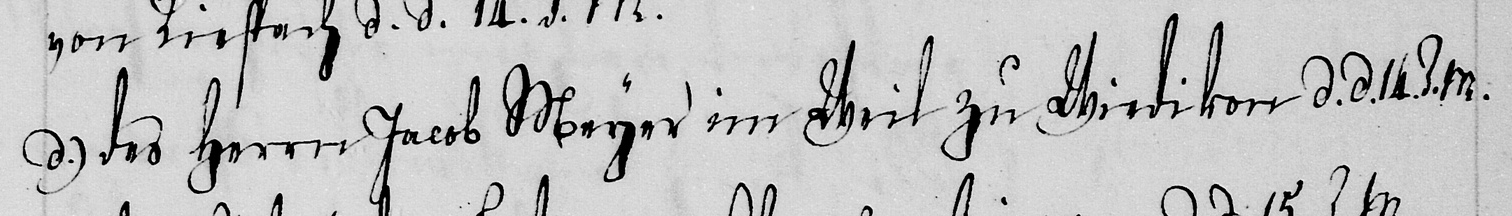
d.) des Herrn Jacob Meyer im Weil zu Wiedikon d. d. 14.
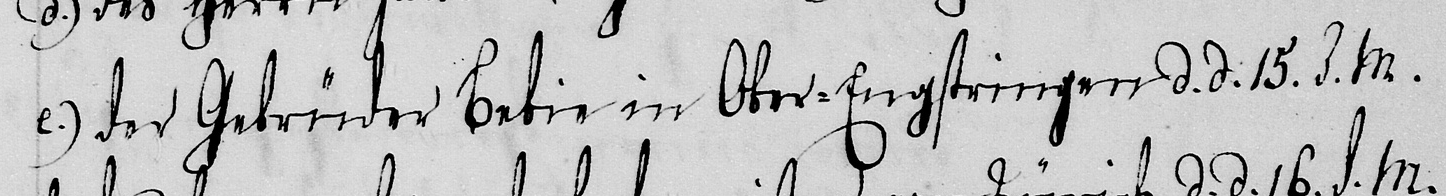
e.) der Gebrüder Bebie in Ober-Engstringen d. d. 15. d. M.
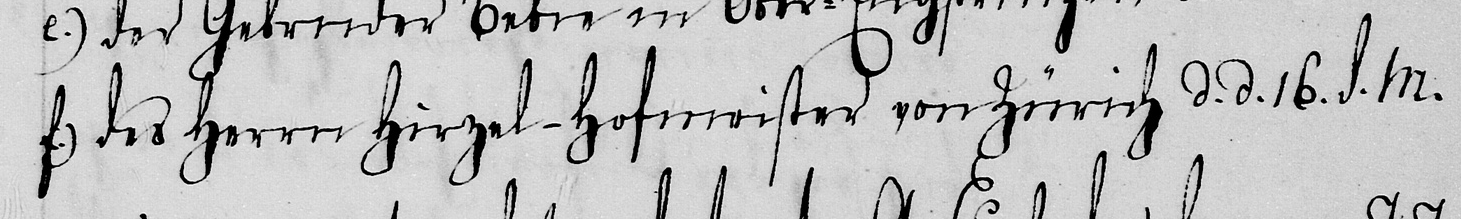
f.) des Herrn Hirzel-Hofmeister von Zürich d. d. 16. d. M.
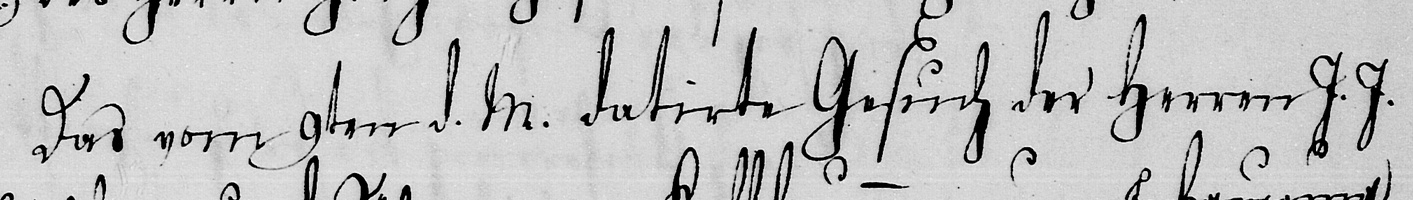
Das vom 9ten d. M. datirte Gesuch der Herren J. J.
